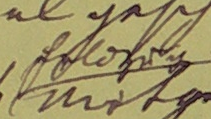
Feldzug
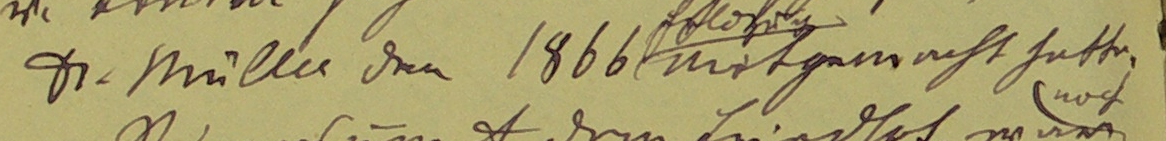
Dr. Müller den 1866 mitgemacht hatte,
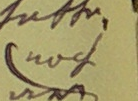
noch
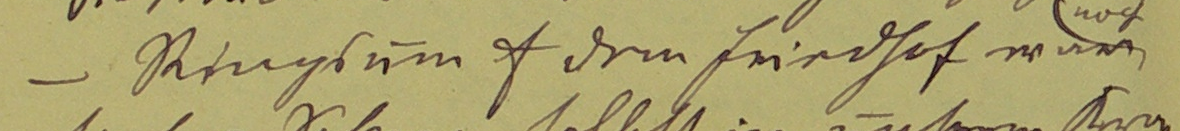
-Ringsum auf dem Friedhof war
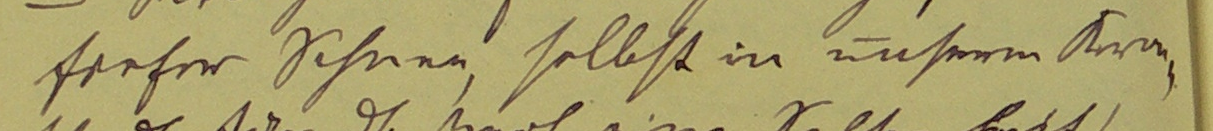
tiefer Schnee, selbst in unserem Kron¬
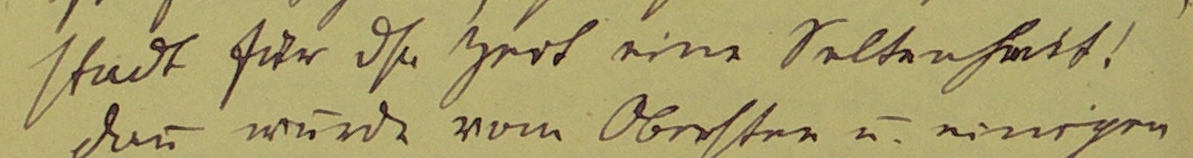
stadt für diese Zeit eine Seltenheit!-
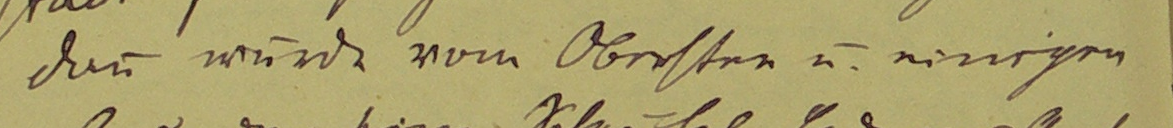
Dann wurde vom Obersten und einigen
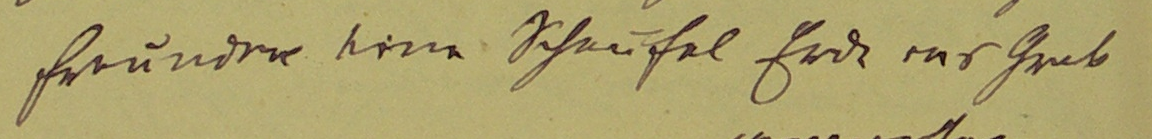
Freunden eine Schaufel Erde ins Grab
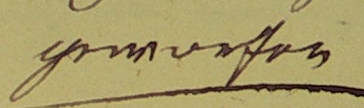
geworfen
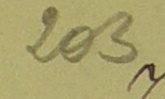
203
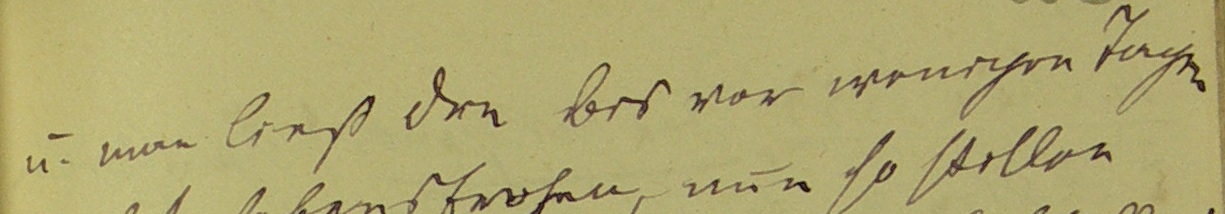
und man ließ den bis vor wenigen Tagen
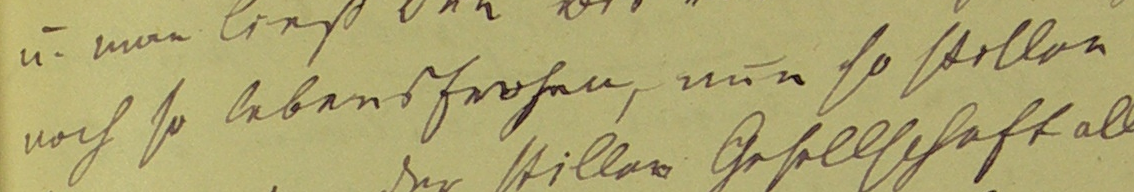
noch so lebensfrohen nun so stillen
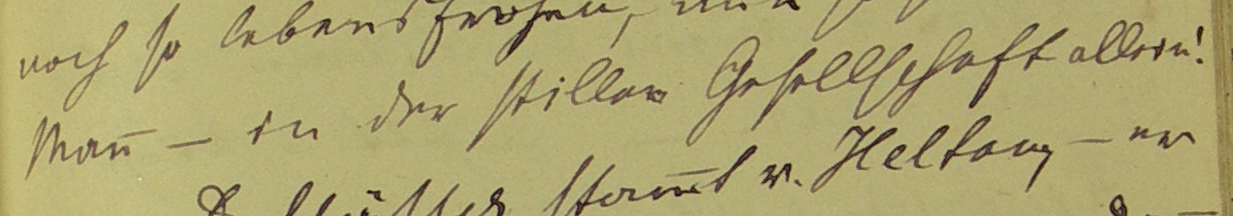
Mann- in der stillen Gesellschaft allein !
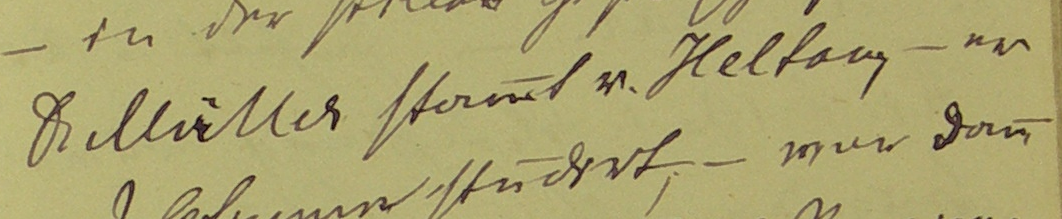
Dr. Müller stammt von Heltau,- er
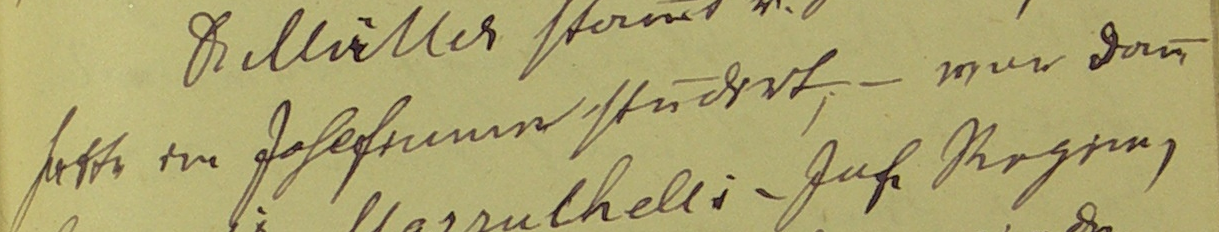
hatte im Josefinum studiert,- war dann
